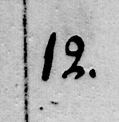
12.
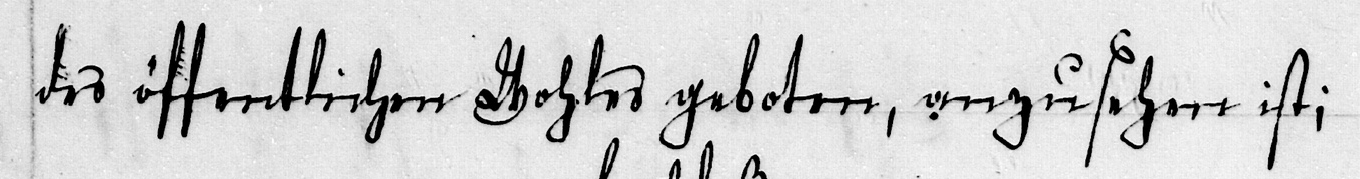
des öffentlichen Wohles geboten, anzusehen ist;
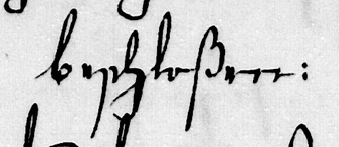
beschloßen:
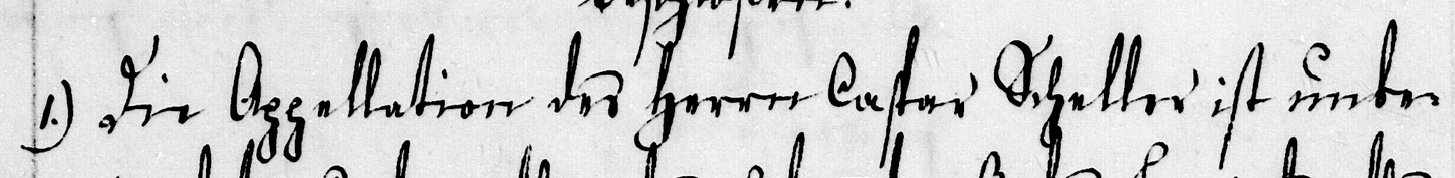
1.) Die Appellation des Herrn Caspar Scheller ist unbe¬
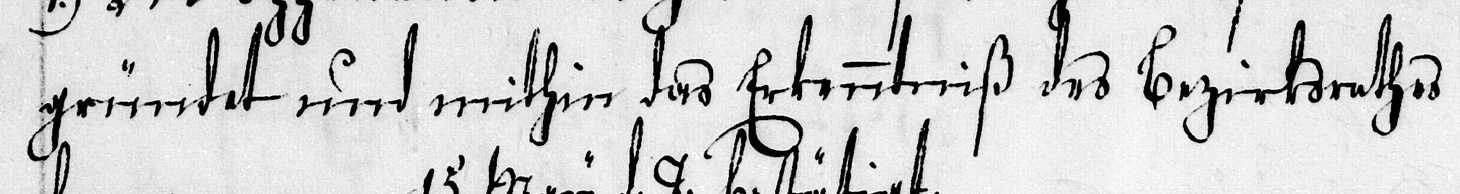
gründet und mithin das Erkenntniß des Bezirksrathes
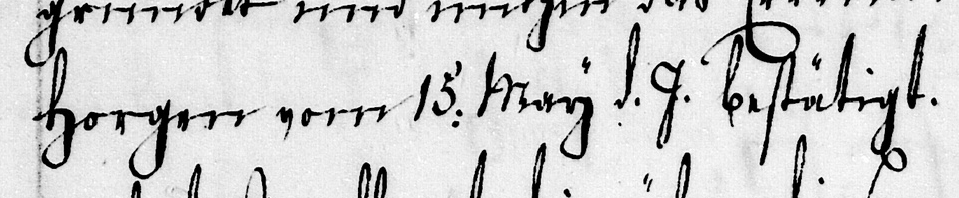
Horgen vom 15 .May d. J. bestätigt.
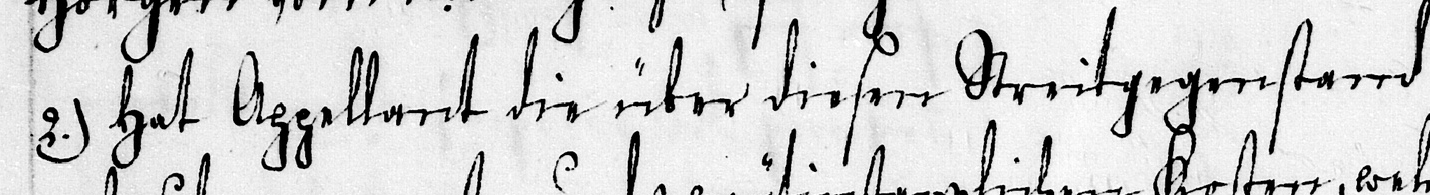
2.) Hat Appellant die über diesen Streitgegenstand
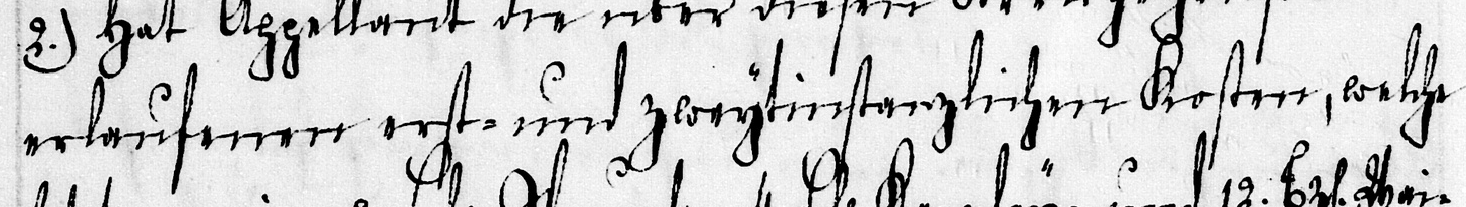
erlaufenen erst- und zweytinstanzlichen Kosten, welche
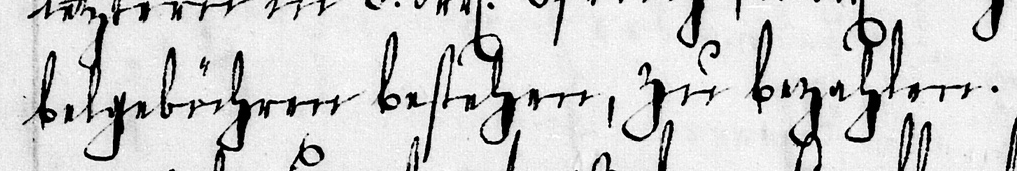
belgebühren bestehen, zu bezahlen.
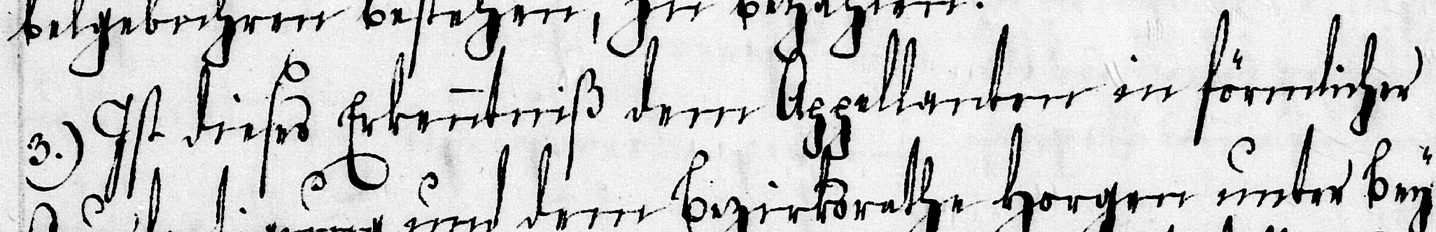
3.) Ist dieses Erkenntniß dem Appellanten in förmlicher
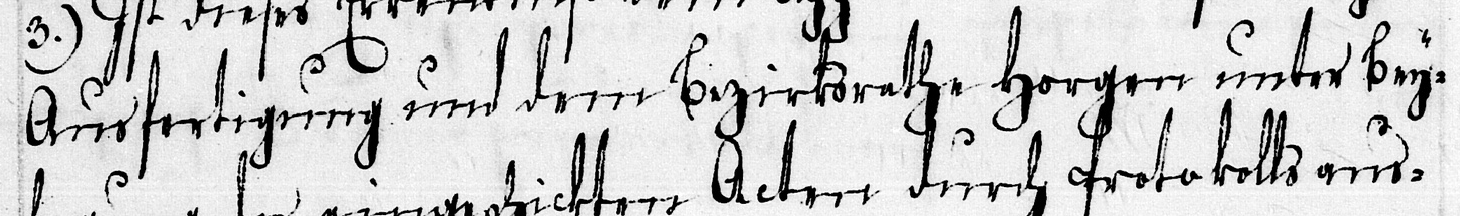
Ausfertigung und dem Bezirksrathe Horgen unter Bey¬
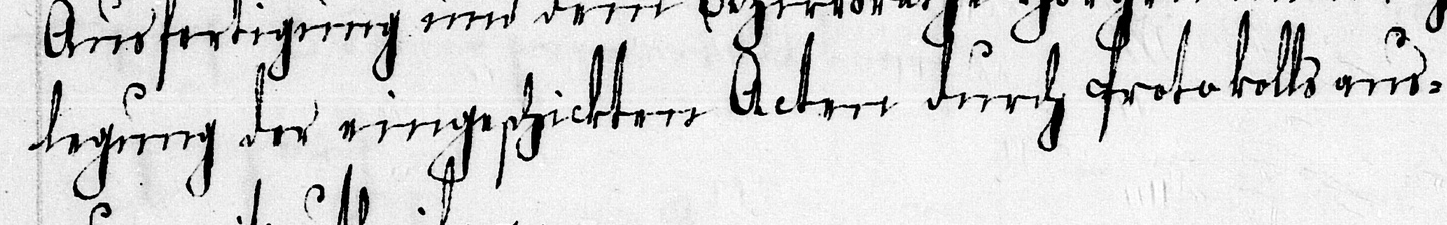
legung der eingeschickten Acten durch Protokollsaus¬
